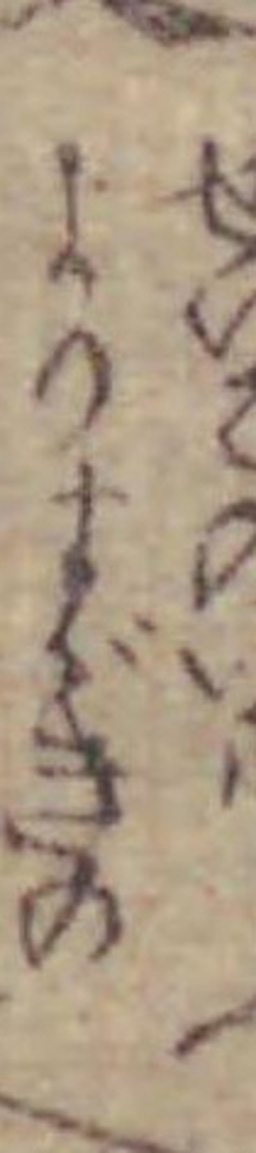よりすゞきの
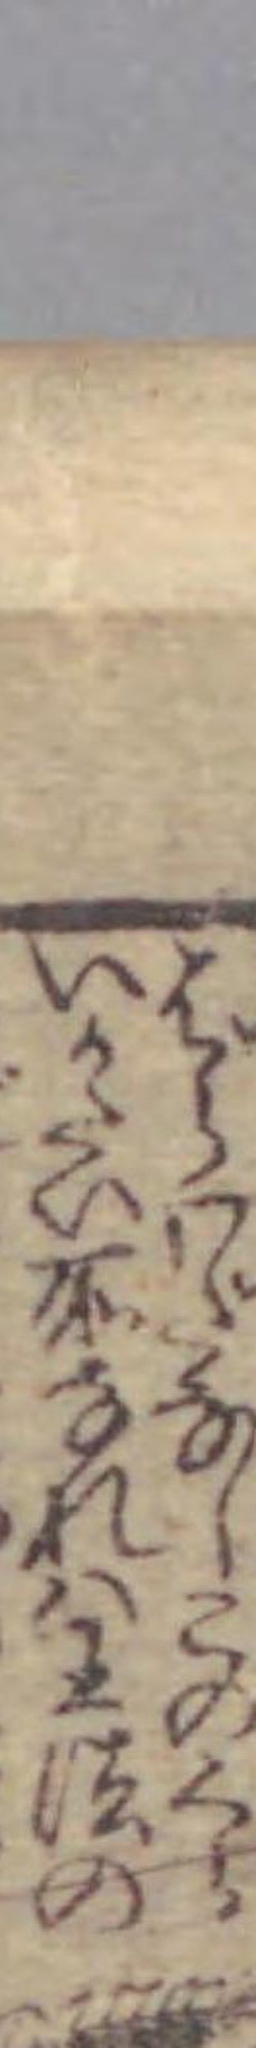いかたい所なれは王法の
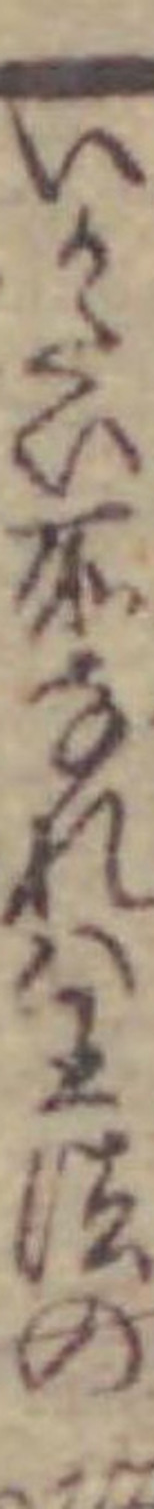いかたい所なれは王法の
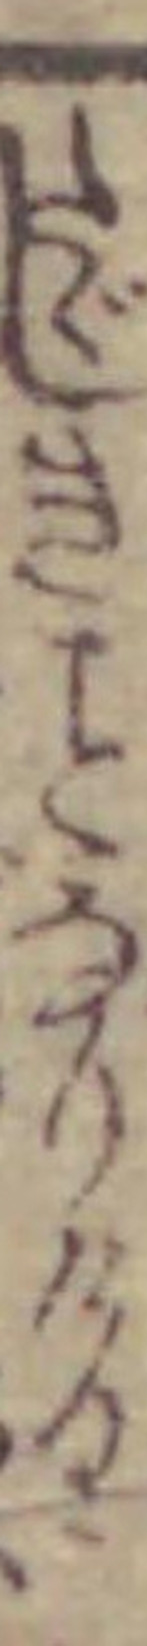たゞしきことなりける
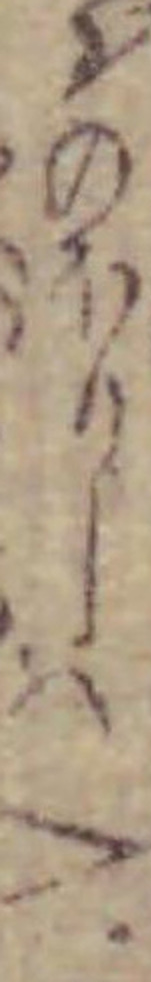のほりしは
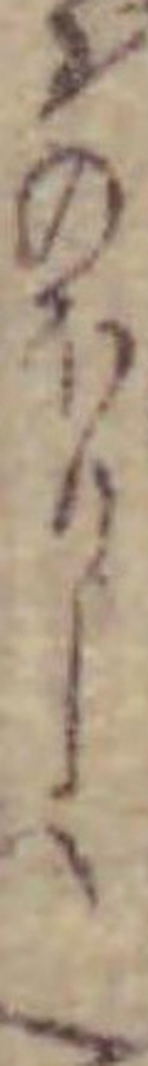のほりしは
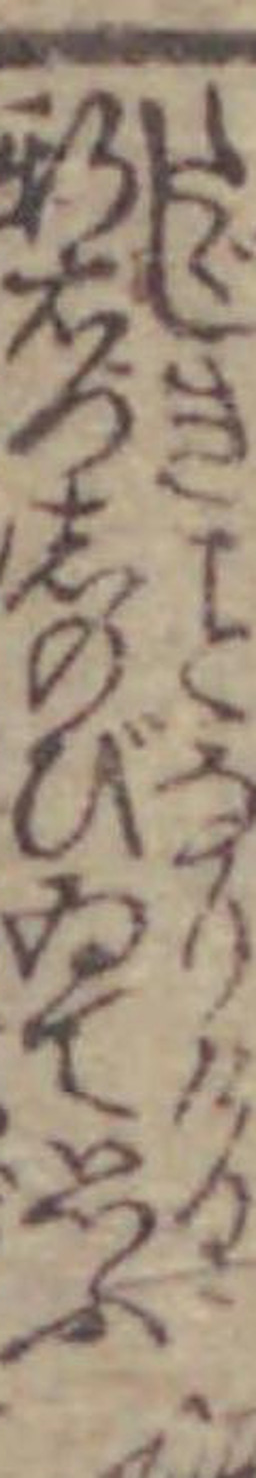新右衛門しのびゐて思ふ
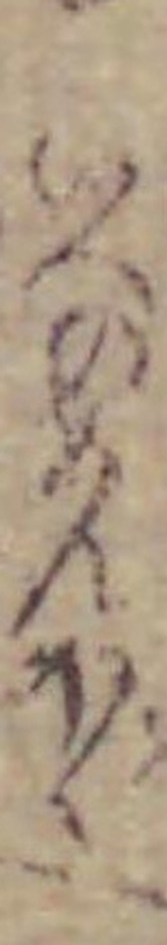いへのめんほく
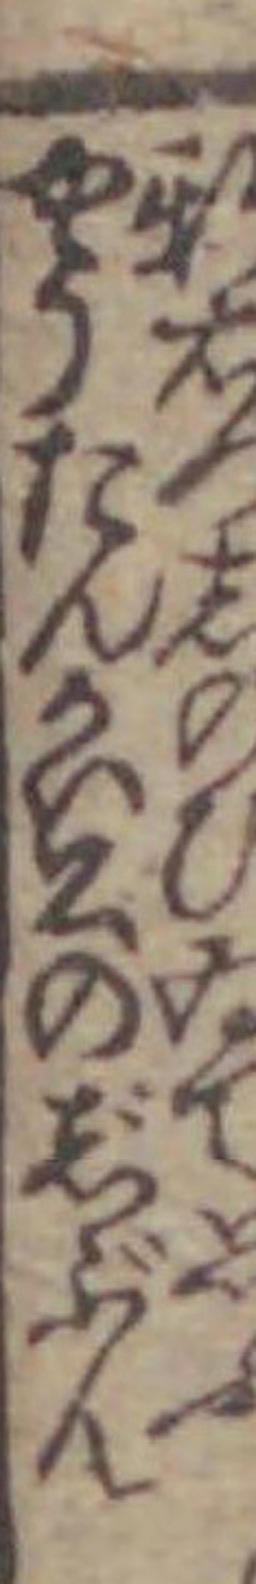やうたんかい公のじぶん
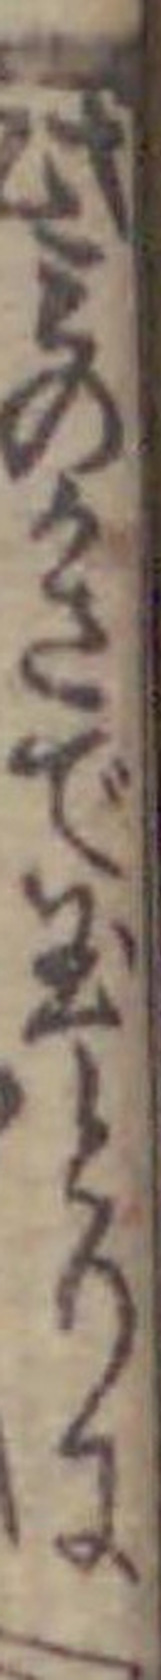此みのかさで玉とりに
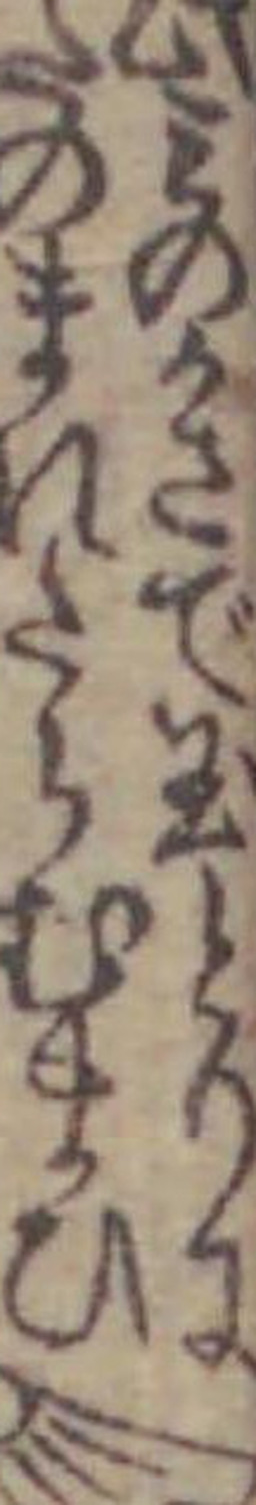たのまれたらむまひ
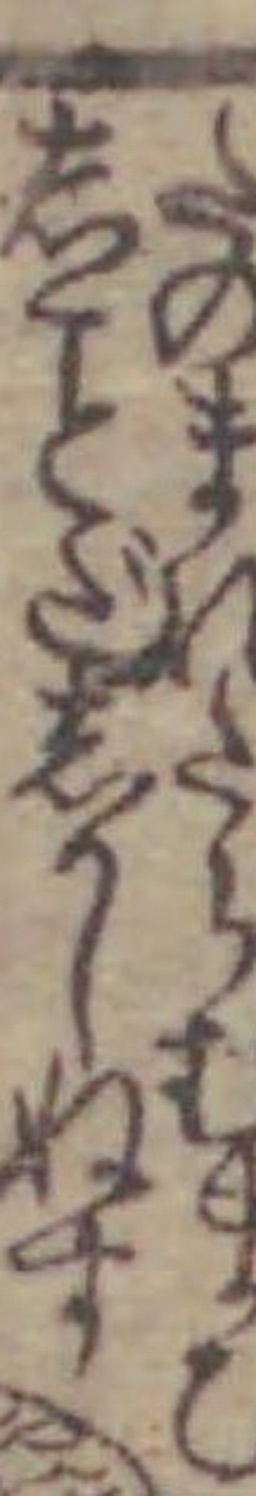しことだしかしぬす
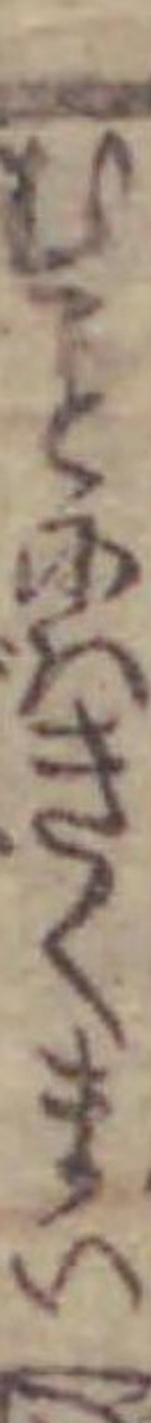むことにはきくまい
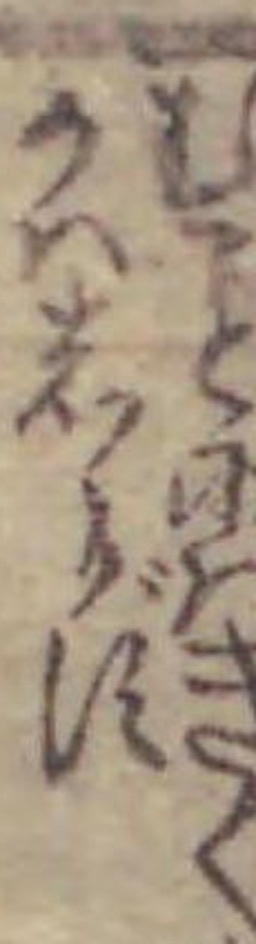かはしらず
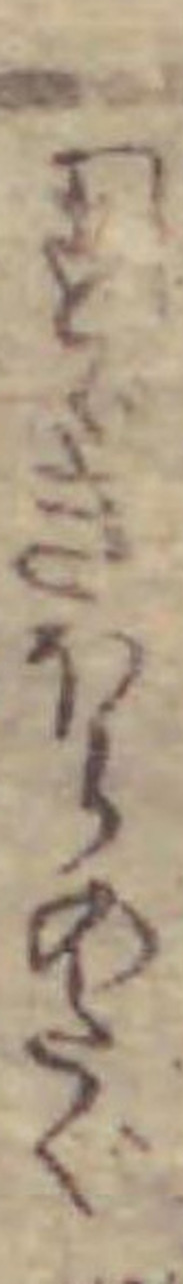〽すゞきほらのたぐ
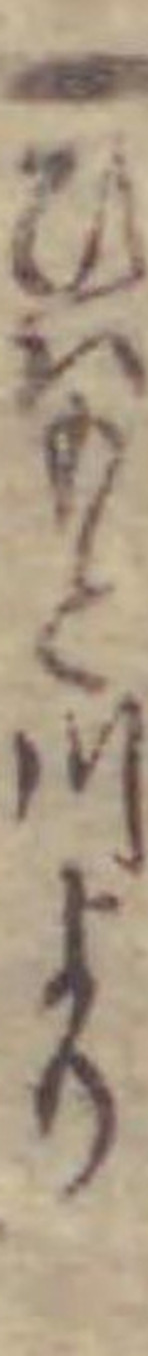ひはもと川より
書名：即席耳学問 : 3巻
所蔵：国立国会図書館 National Diet Library, JAPAN
